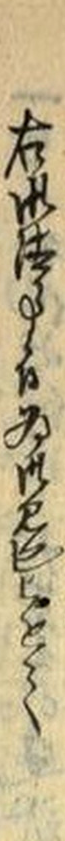右御法事ニ付為御見廻被進之
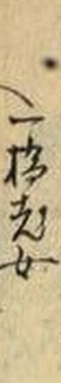一橋老女
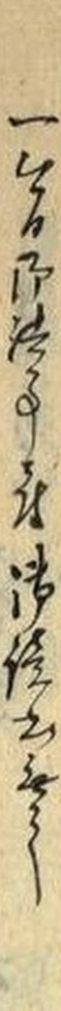一今日御法事ニ付御読書無之
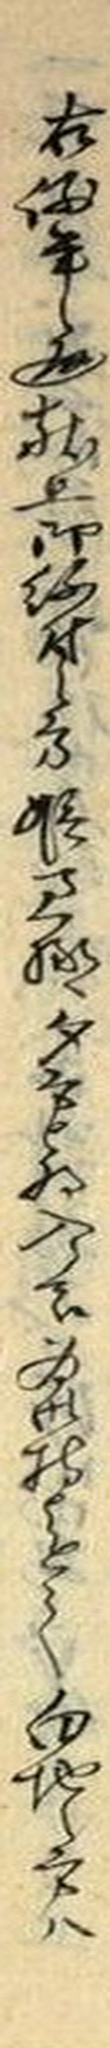右例年之通献上御紋付之方姫君様へ夕方為入候節為御持被進之白地之方ハ
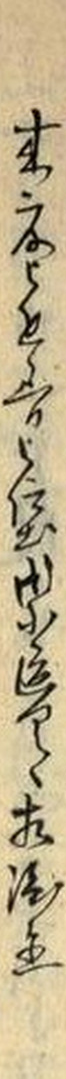来夏被進候旨被仰出御小道具へ相渡置
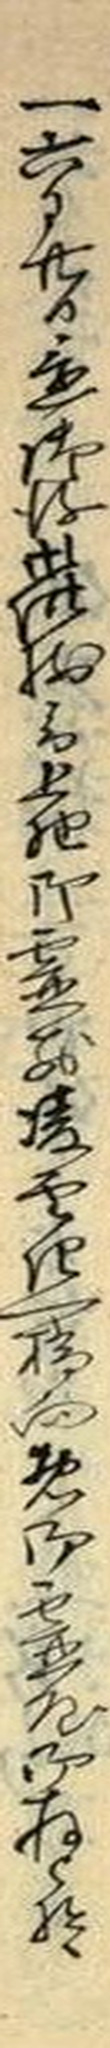一六月廿日昼御後御供揃ニ而上野御霊前凌雲院一橋向惣御霊屋御拝被遊候
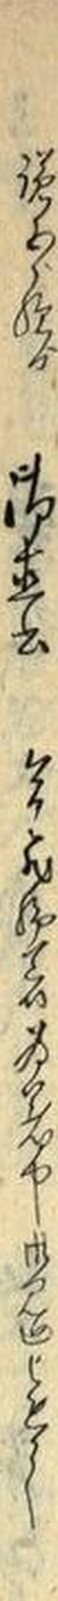謙五郎様ゟ御直書今日飛脚着為暑中御見廻被進之
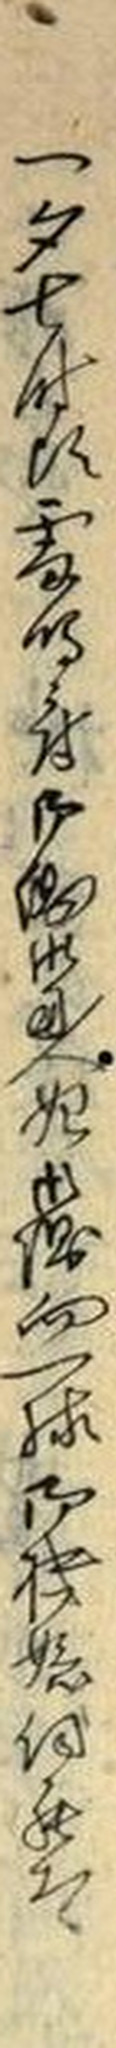一夕七時頃雷鳴ニ付御側御用人始御側向一統御機嫌伺罷出候

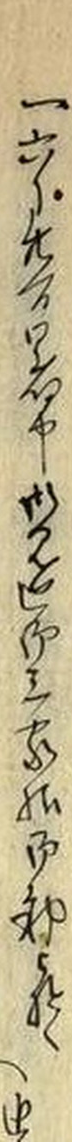一六月廿一日暑中御見廻御三家様御勤被遊候
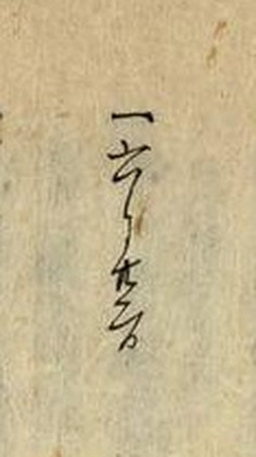一六月廿四日
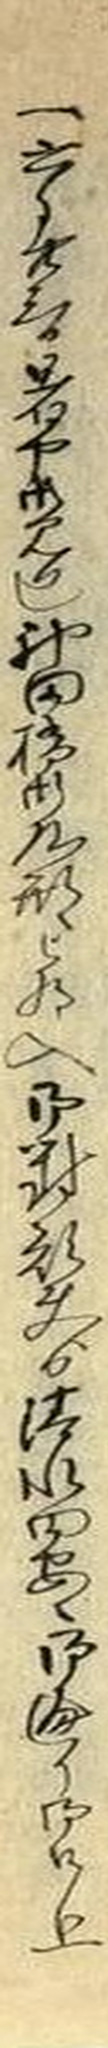一六月廿三日暑中御見廻神田橋御屋形へ被為入御対顔夫ゟ清水田安へ御通り御口上
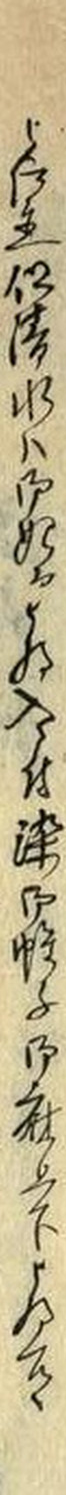被仰置但清水ハ御始而被為入候付染御帷子御麻上下被為召候
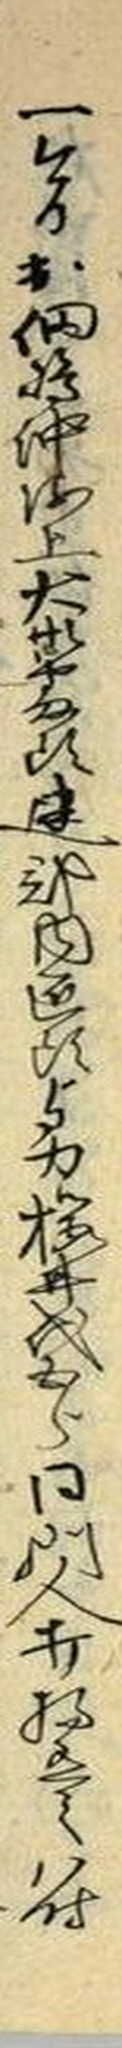一今日於佃嶋沖海上大御番頭建部内匠頭与力桜井代五郎同門人打揚有之八時
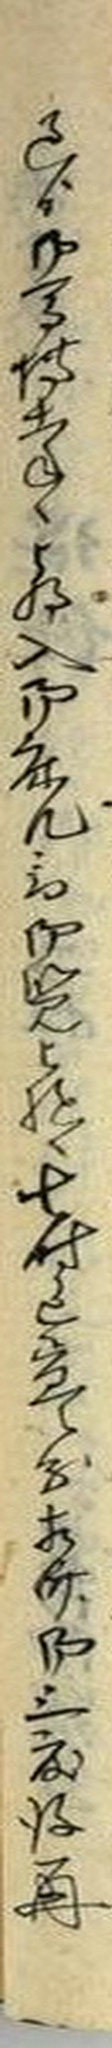過ゟ御馬場土手へ被為入御床几ニ而御覧被遊候七時過昼之分相済御三度後再
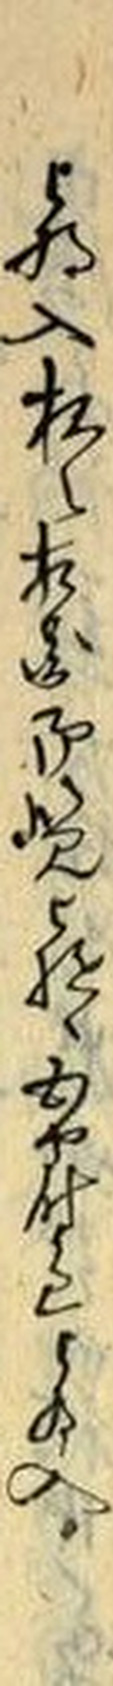被為入夜之相図御覧被遊候五半時過被為入候
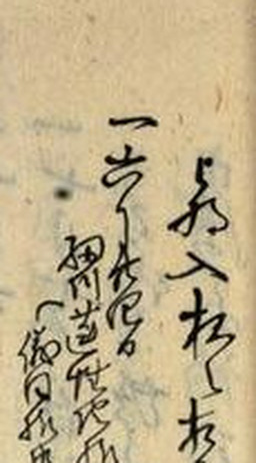一六月廿四日
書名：少傅日録抄（斉承付側向頭取日記、在府）
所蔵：福井県文書館 Fukui Prefectural Archives
